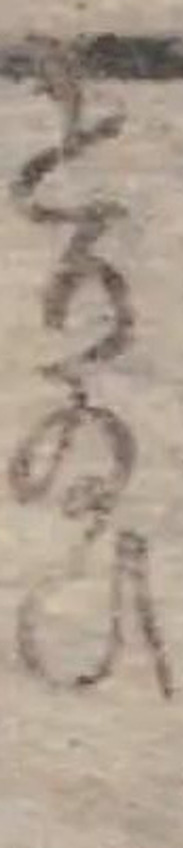とり給ひ
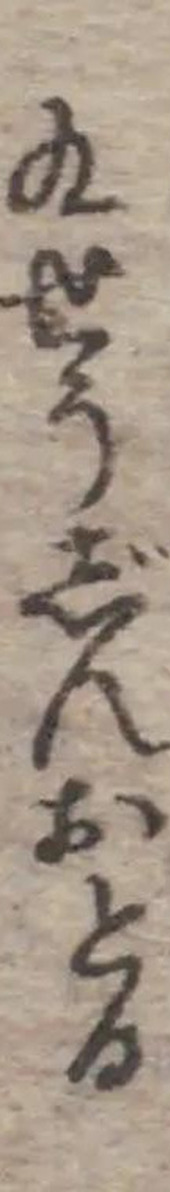九せうじんおとる

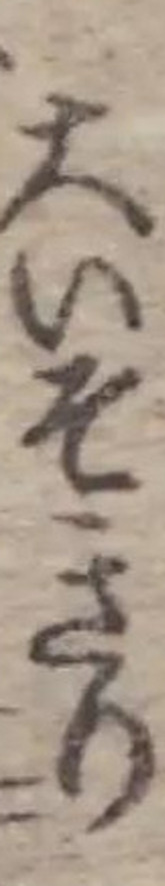大いそきり
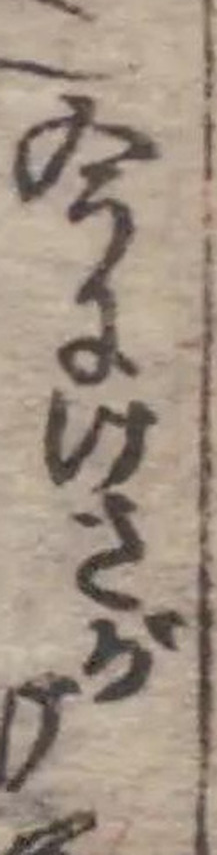今にけさが
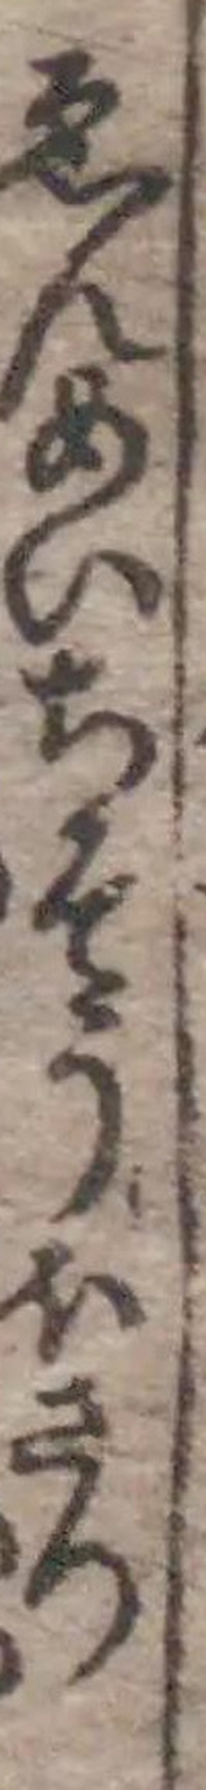ゑんめいちそうほさつ
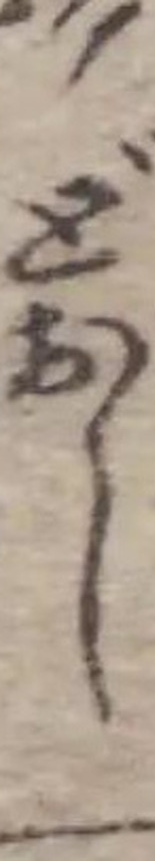どおし
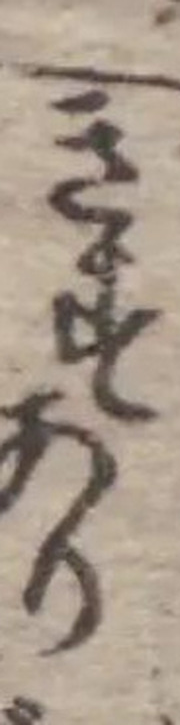きすあり
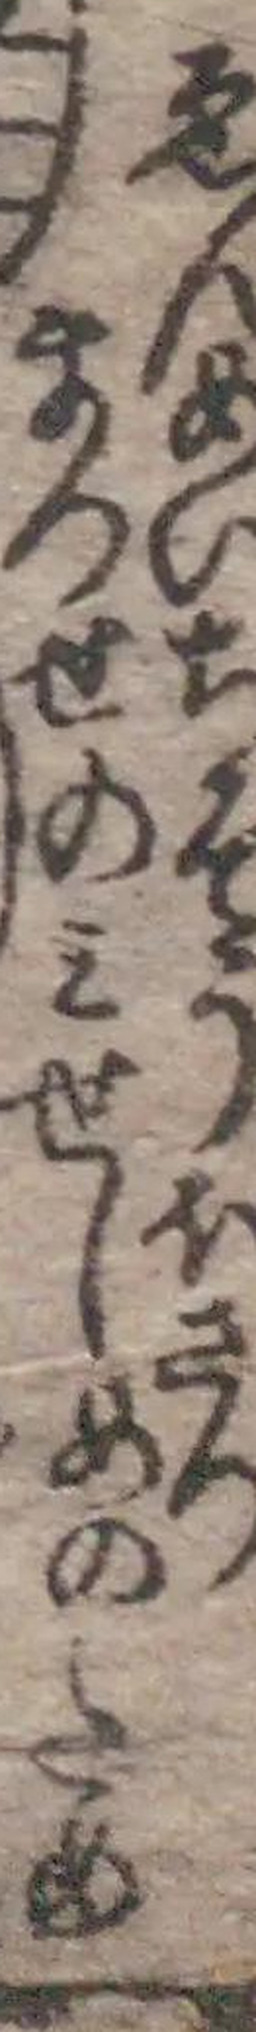まつ世のみせしめのため
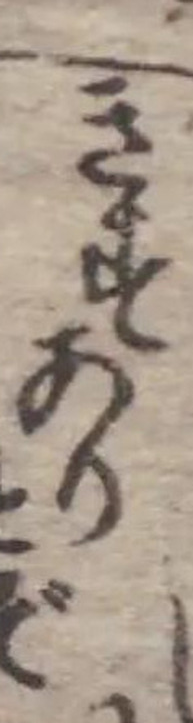きすあり
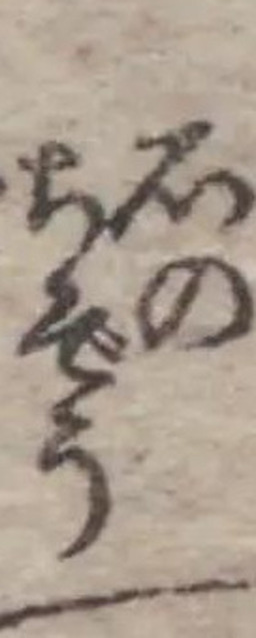ちぞう
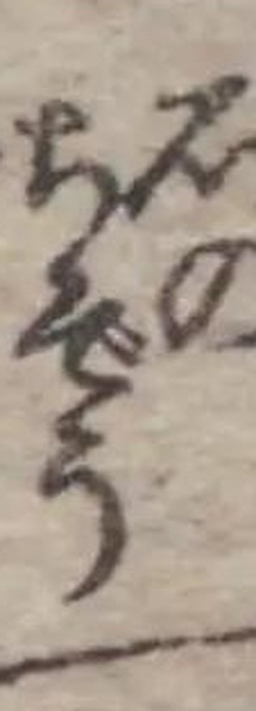ちぞう
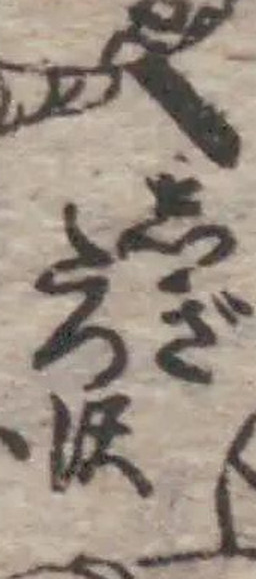たつ沢
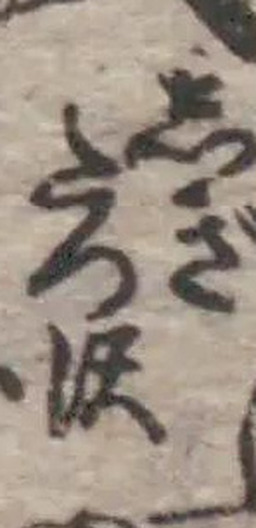たつ沢
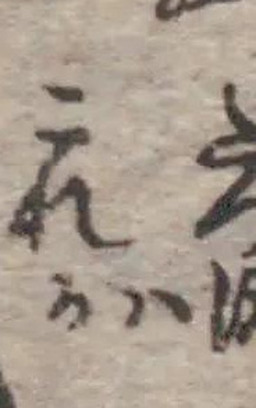これか
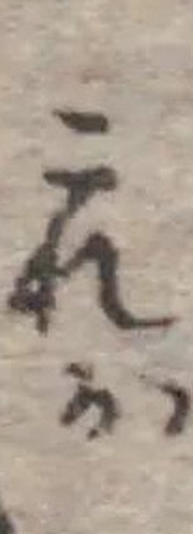これか
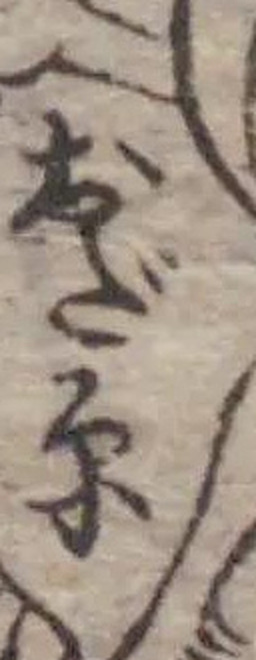おだ原
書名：大磯地蔵咄 2巻
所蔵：国立国会図書館 National Diet Library, JAPAN
